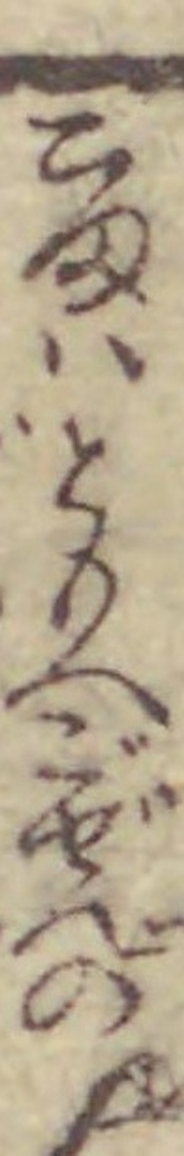こまはともへごぜんの
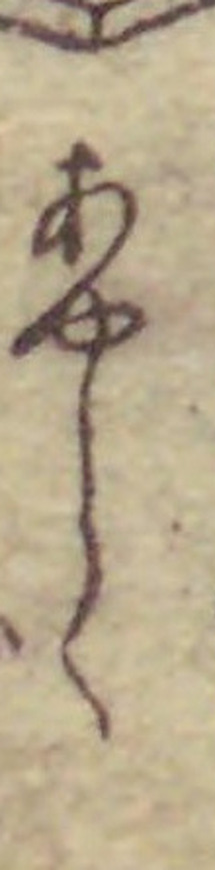あやしく
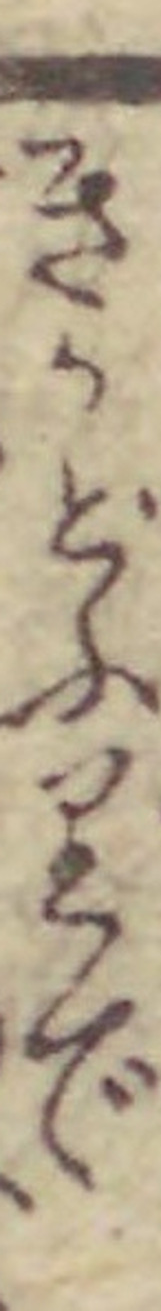きかどふりで
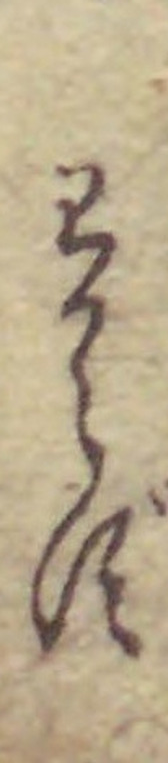わからず
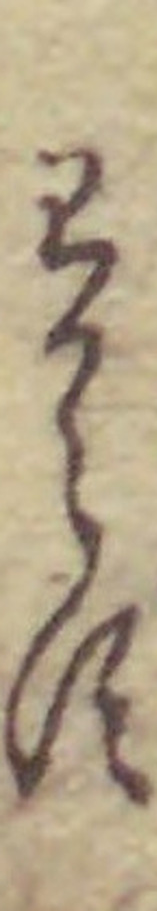わからず
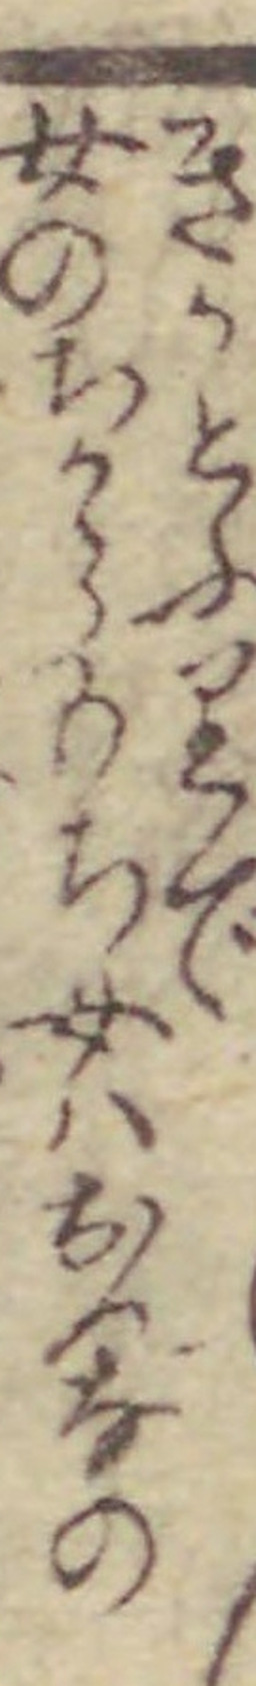女のちからもち女はおんなの
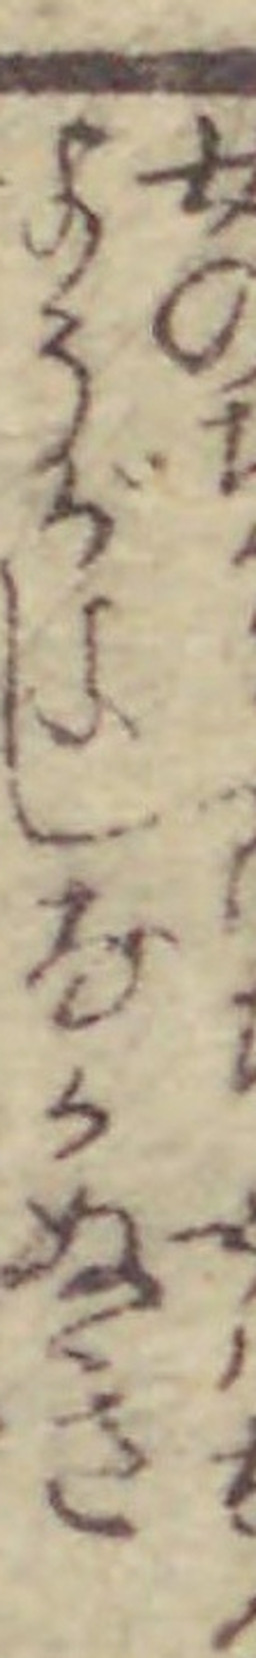ようがよしなかぬき
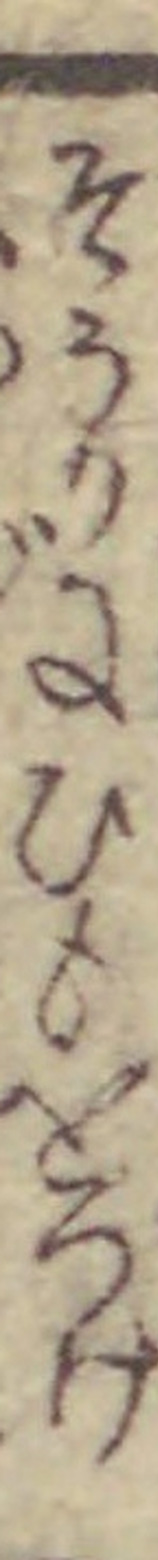そうりにひもをつけ
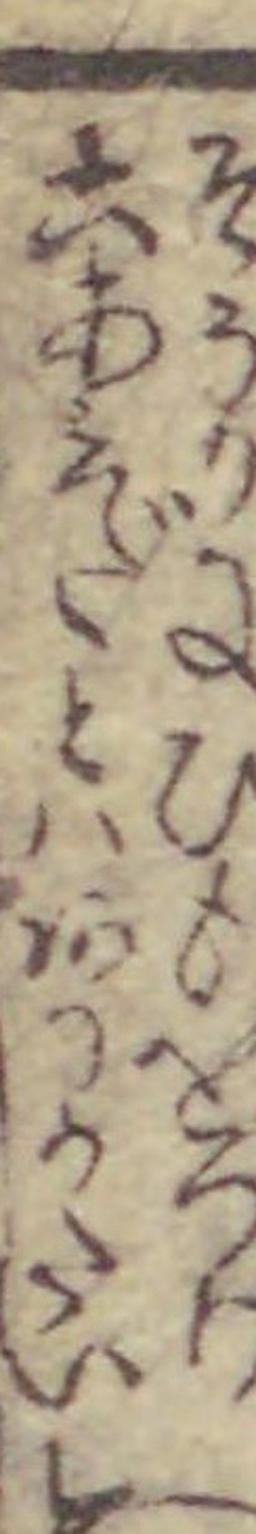六あみだとはありかたい

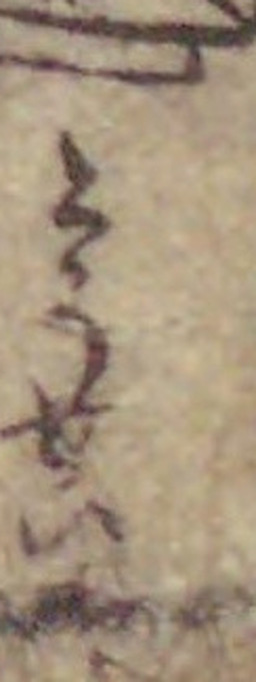とうせい
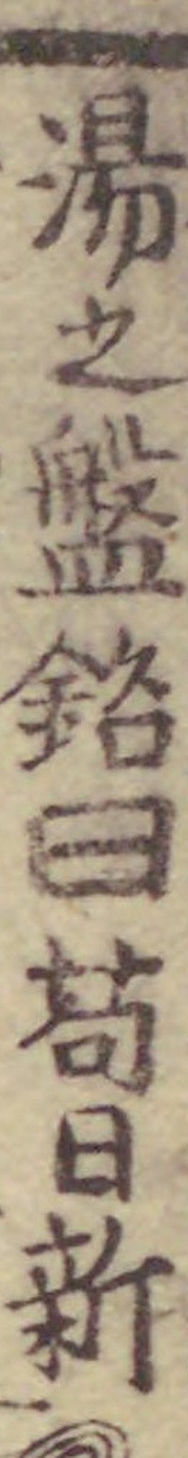湯之盤銘曰苟日新
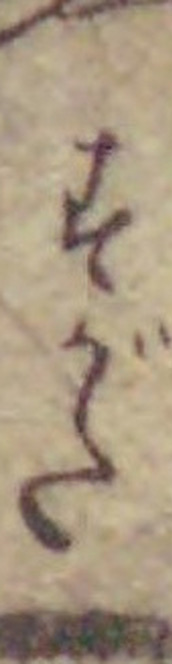すがた
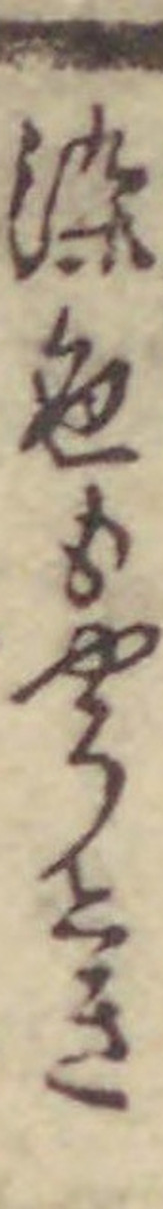染色もやうとき
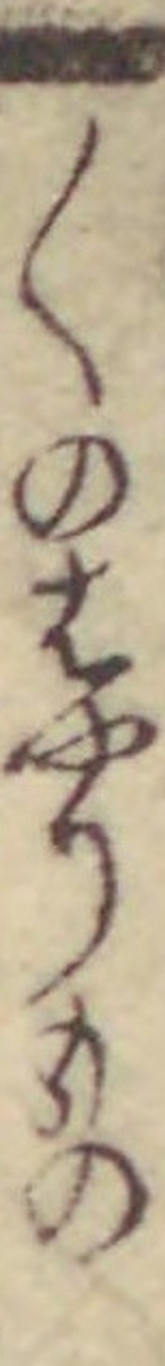〳〵のはやりもの
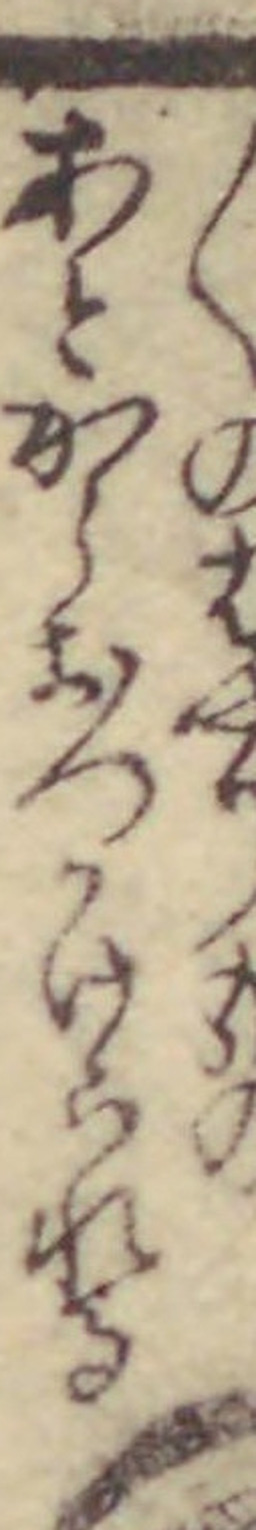あとからおつかけられる
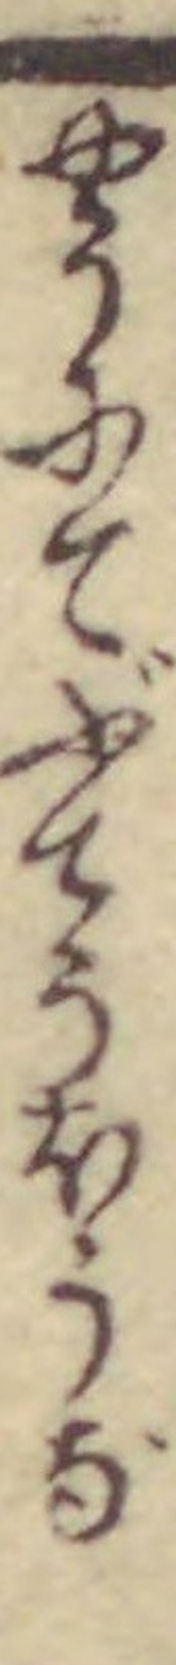やうにてぶてうほうな
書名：大通人穴[サガシ] 3巻
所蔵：国立国会図書館 National Diet Library, JAPAN
